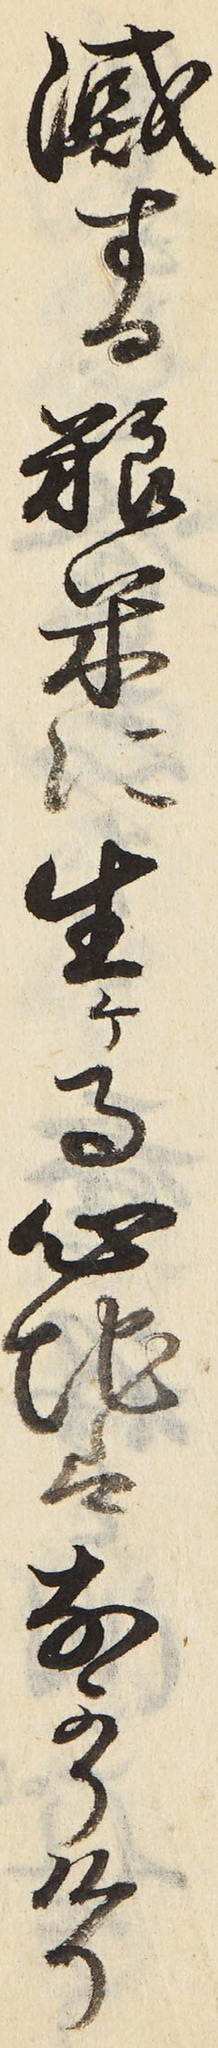滅する粮米に生ける心地はなかりけり
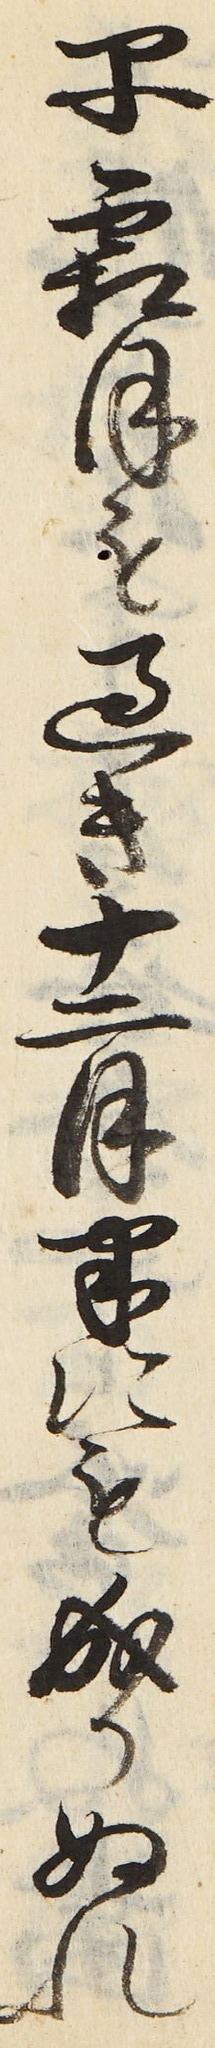早霜月も過き十二月半にも成りぬれ
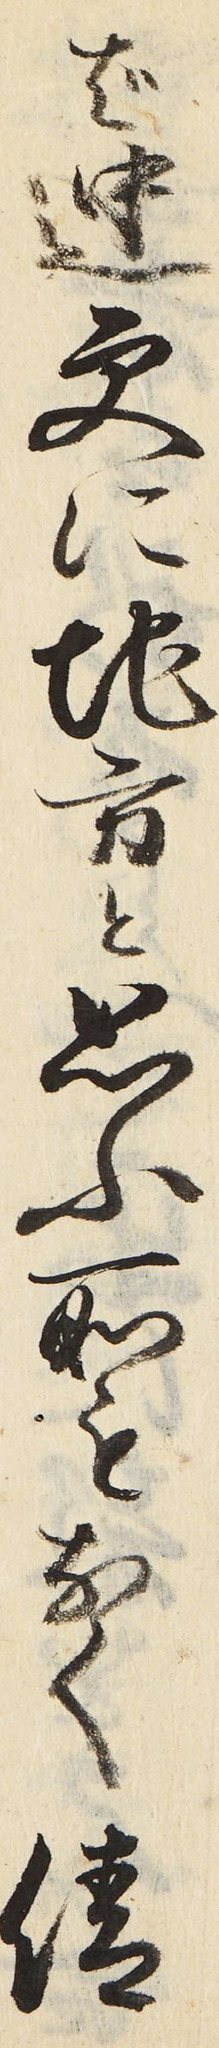ば迚更に地方と思ふ所もなく倩
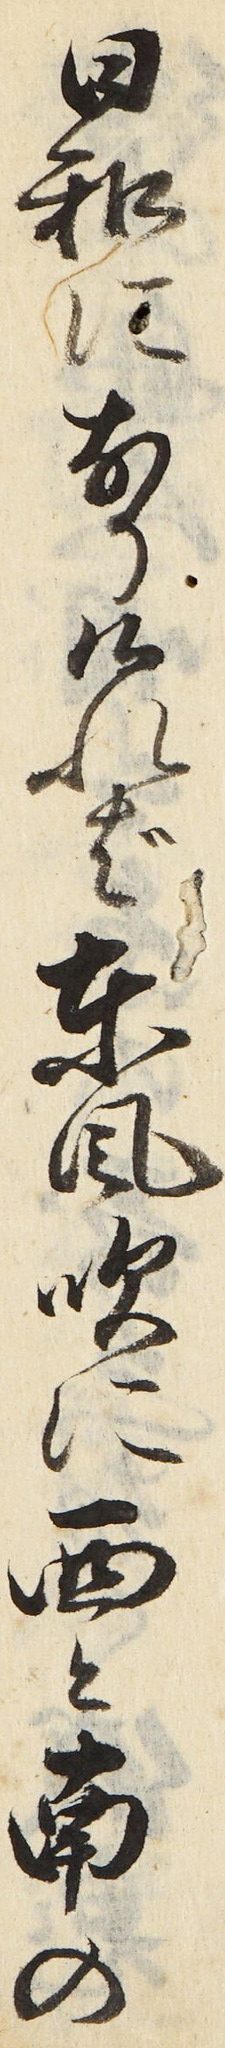日和になりければ東風吹に西と南の
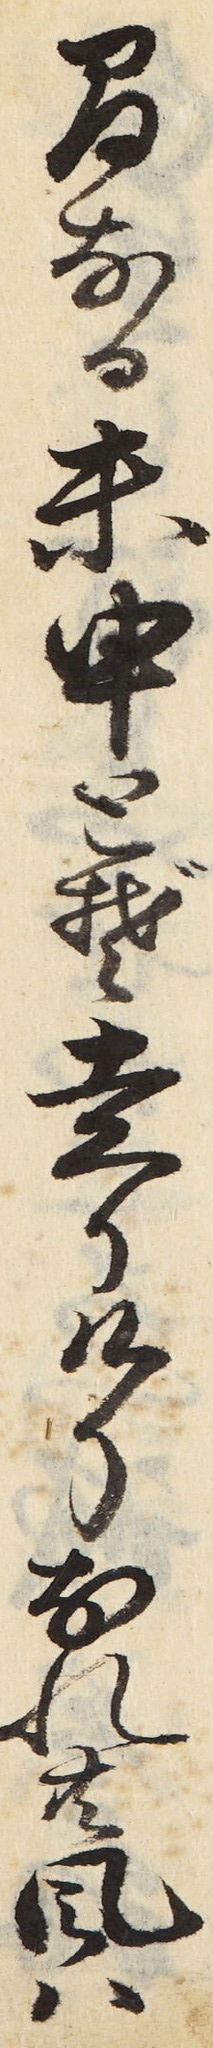間なる未申とぞ走りけりなれ共風は
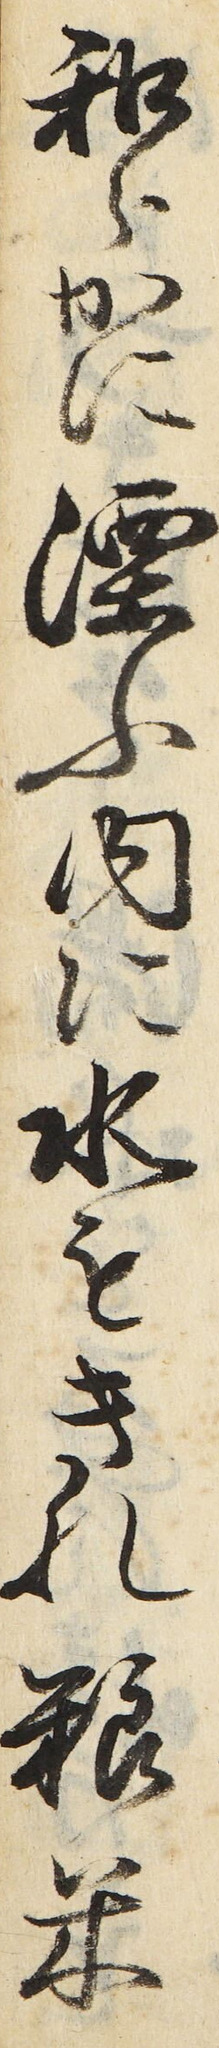和らかに漂ふ内に水もきれ粮米

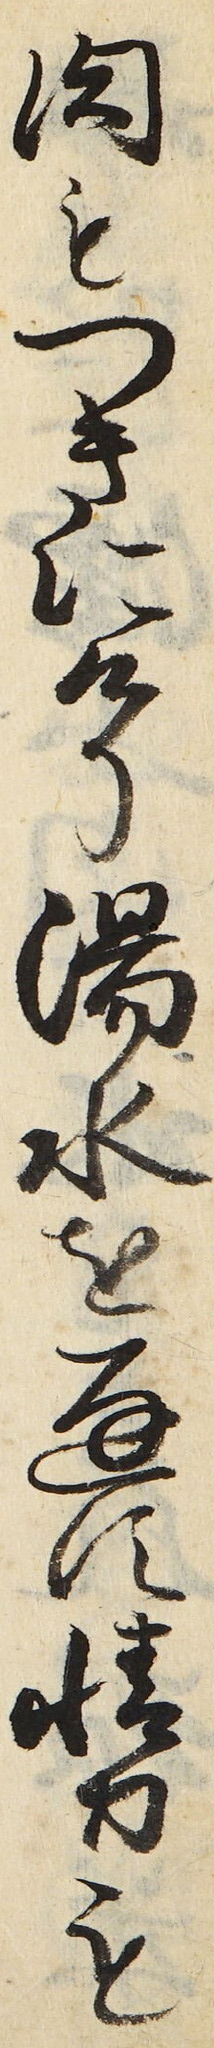肉もつきにけり湯水を通す情力も
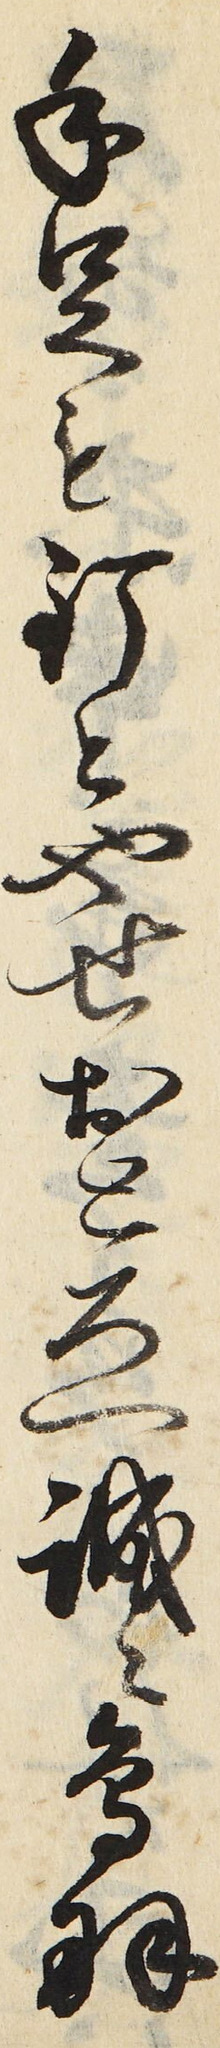手足も釘とやせおとろへ誠に鳥羽
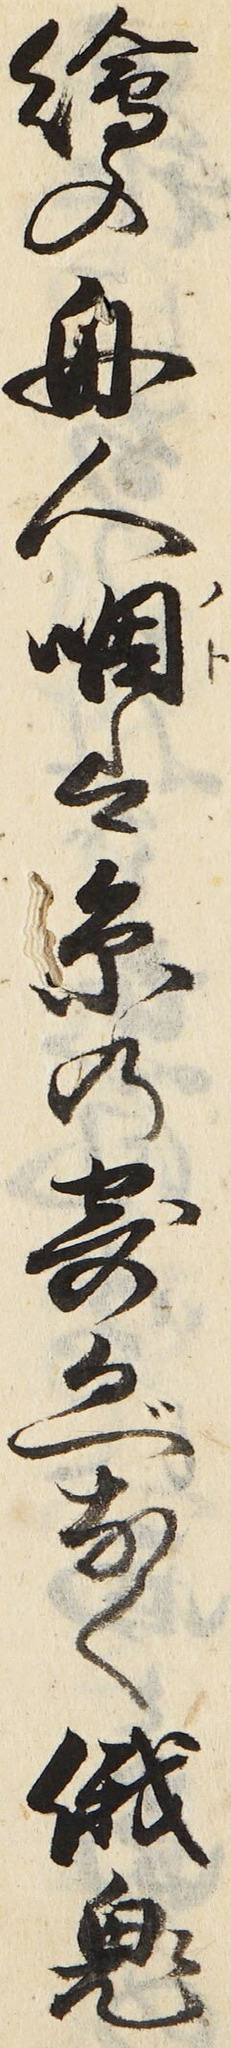絵の舟人咽は糸の寄るべなく餓鬼
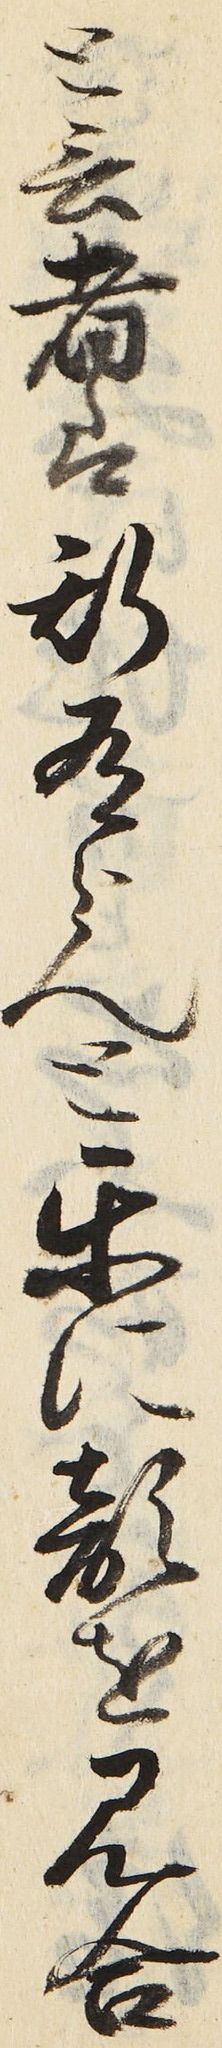と云者は斯有らんと互に顔を見合
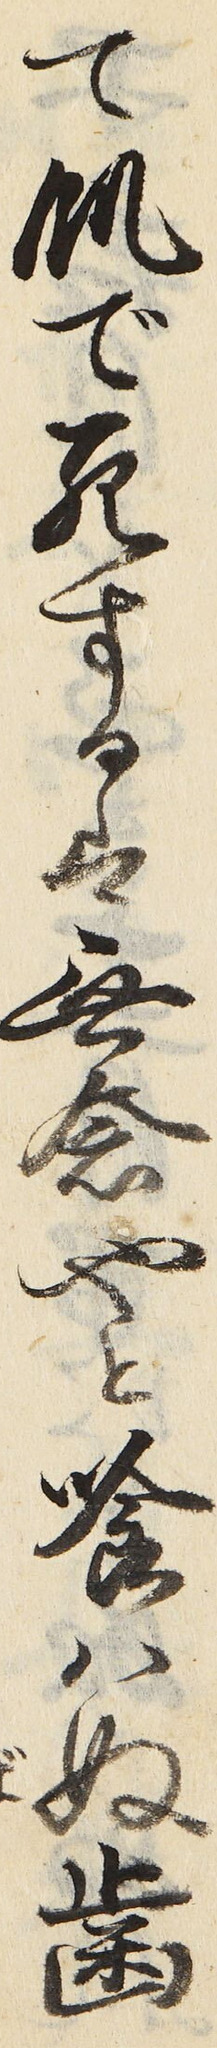て飢で死するは無念やと喰はぬ歯
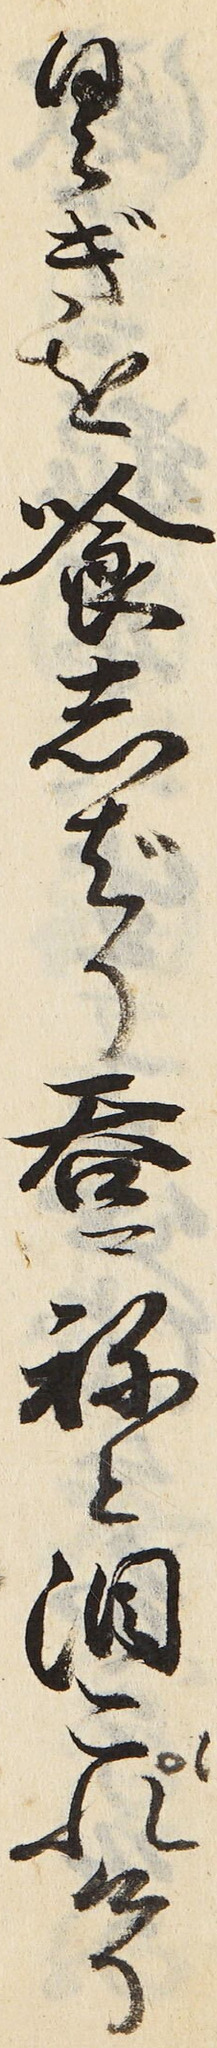くぎを喰しばり呑まねと泪こぼれけり
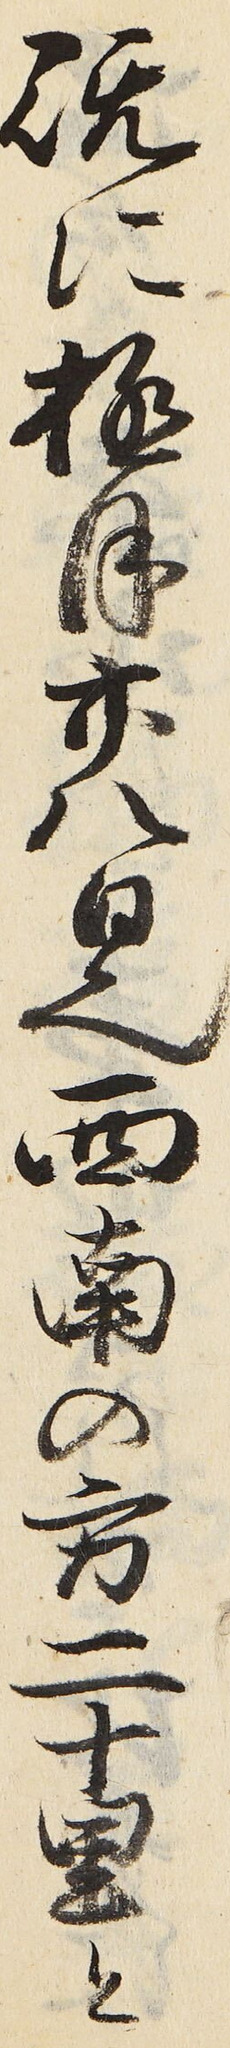既に極月廿八日也西南の方二十里と
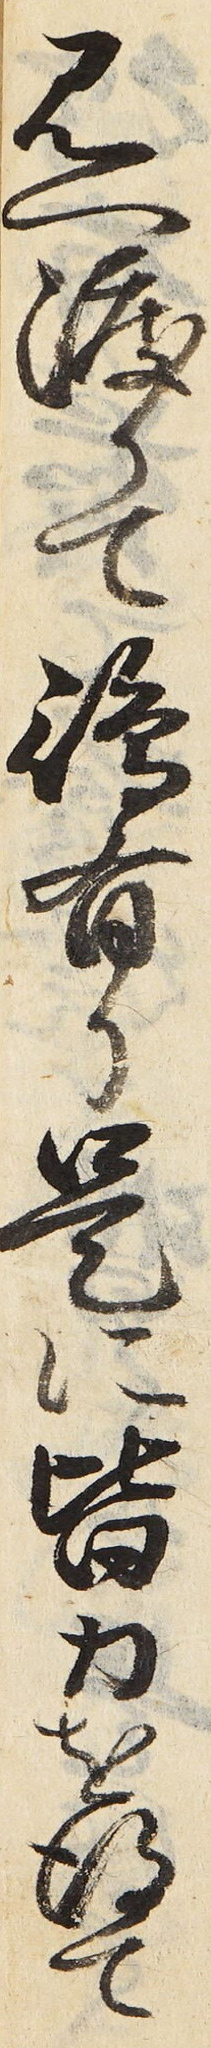見へ渡りて嶋有り是に皆力を得て
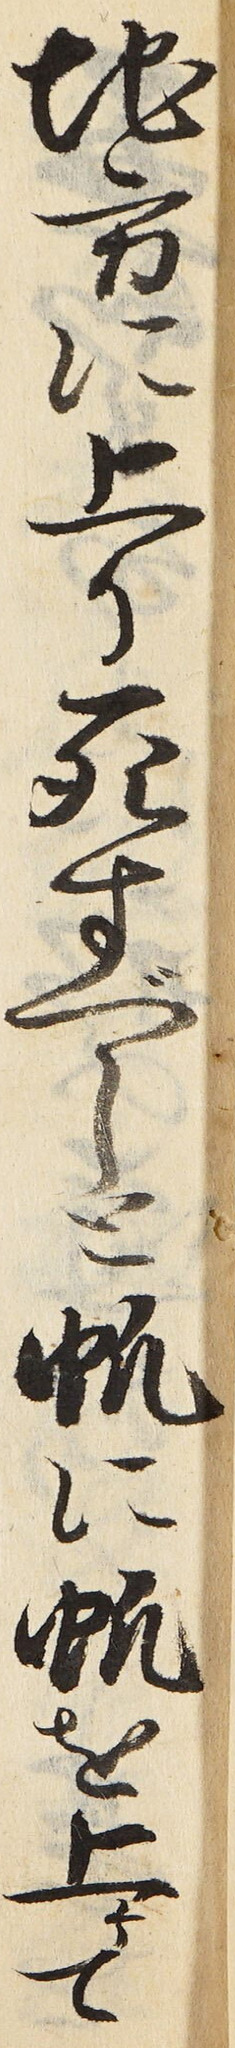地方に上り死すべしと帆に帆を上けて
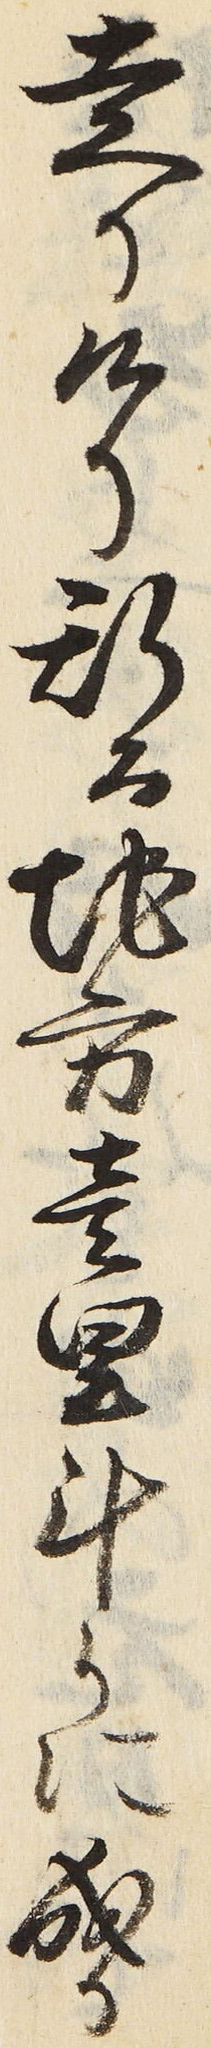走りけり斯而地方壱里計りに成り
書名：華夷九年録
